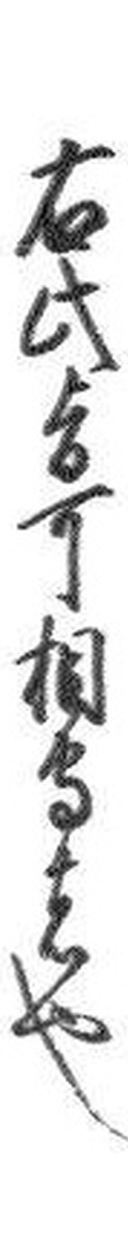右此旨可相守者也
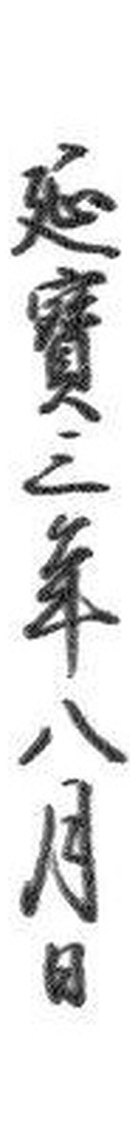延宝三年八月日
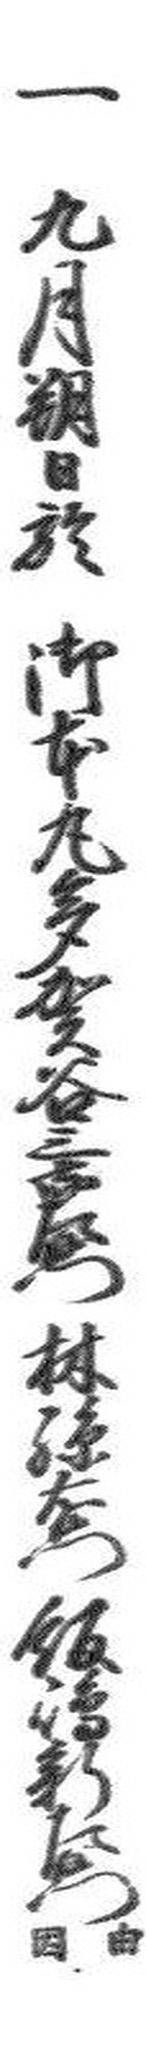一九月朔日於御本丸多賀谷三郎左衛門林孫左衛門飯島新左衛門由因
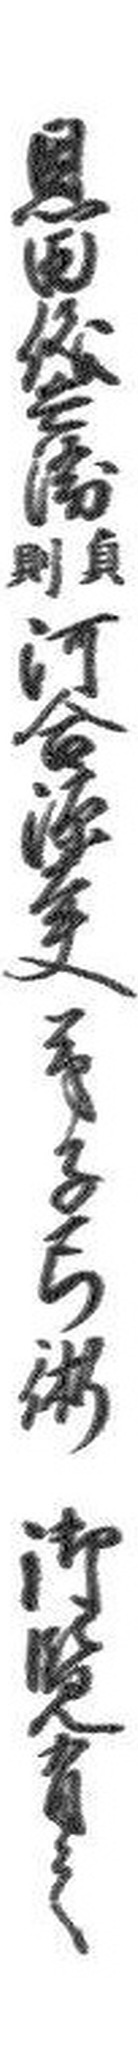恩田儀兵衛貞則河合源太夫弟子弓術御覧有之
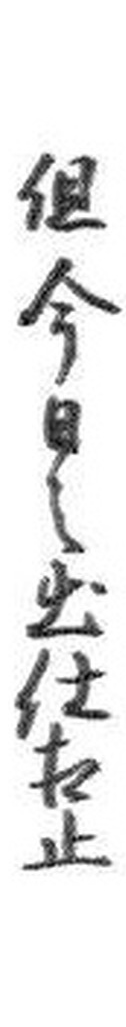但今日之出仕相止
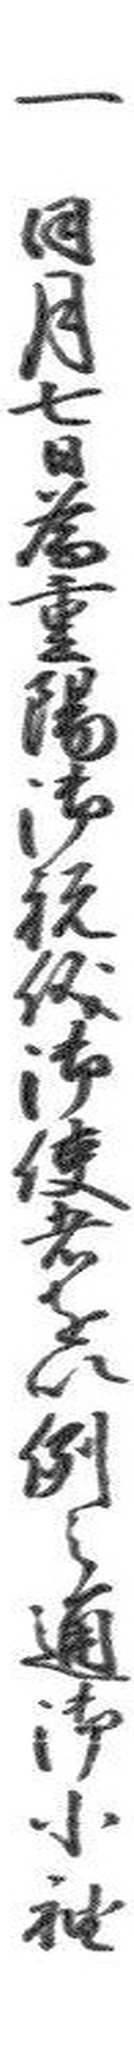一同月七日為重陽御祝儀御使者を以例之通御小袖
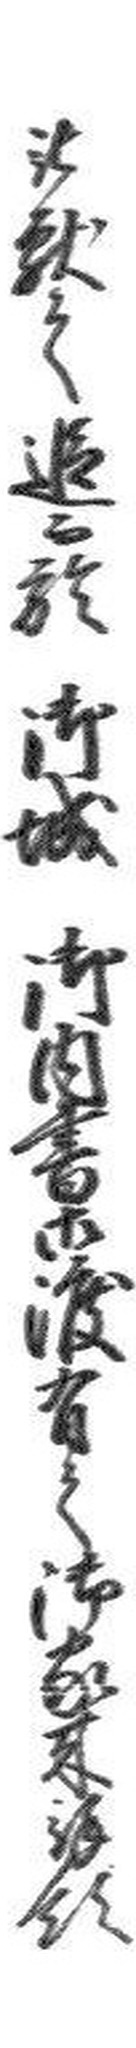被献之追而於御城御内書御渡有之御家来拝領
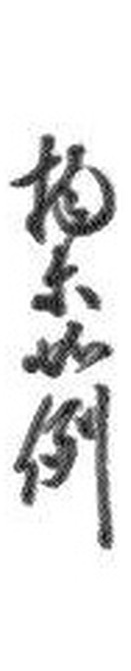物等如例

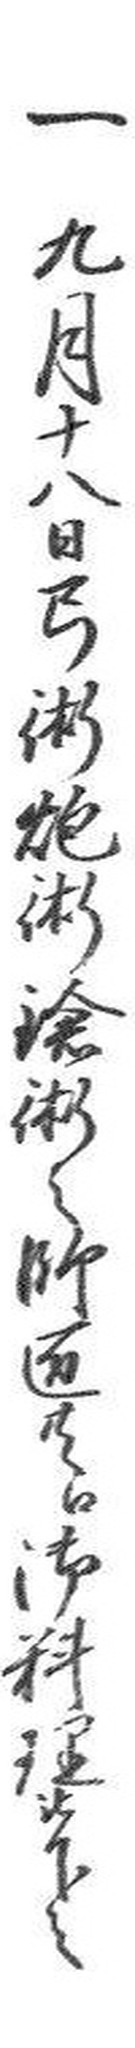一九月十八日弓術炮術鎗術師匠共江御料理被下之
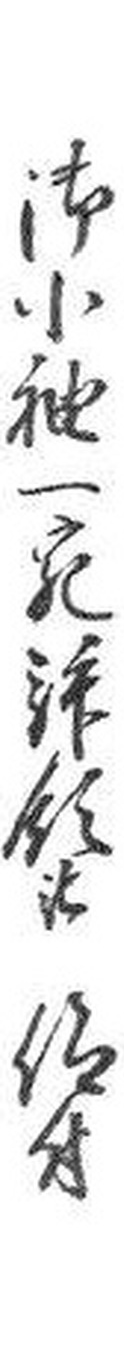御小袖一宛拝領被仰付
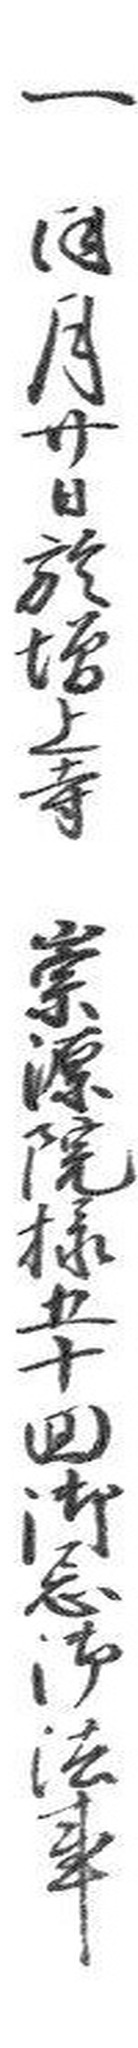一同月廿日於増上寺嵩源院様五十四御忌御法事
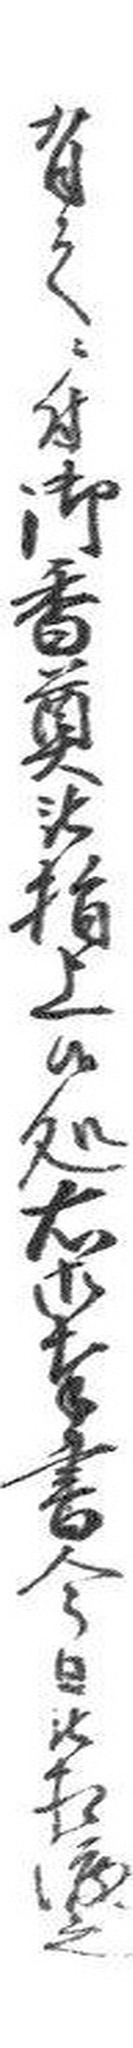有之ニ付御香奠被指上候処右御奉書今日被相渡之
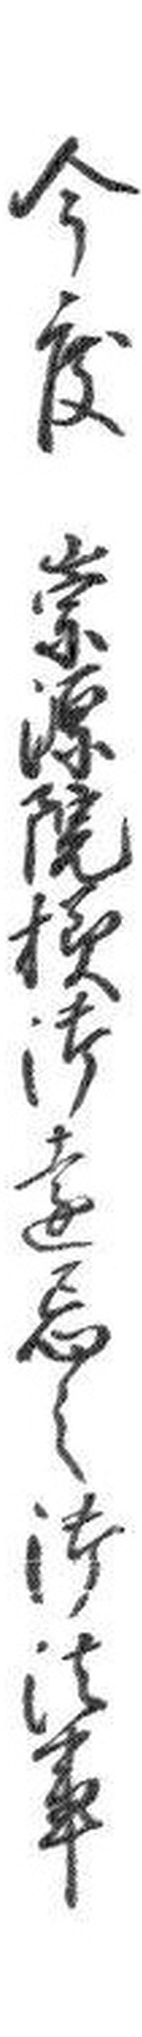今度嵩源院様御遠忌之御法事
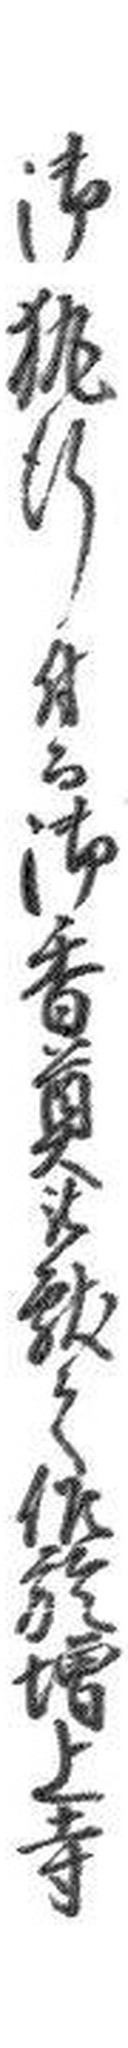御執行付而御香奠被献之候於増上寺
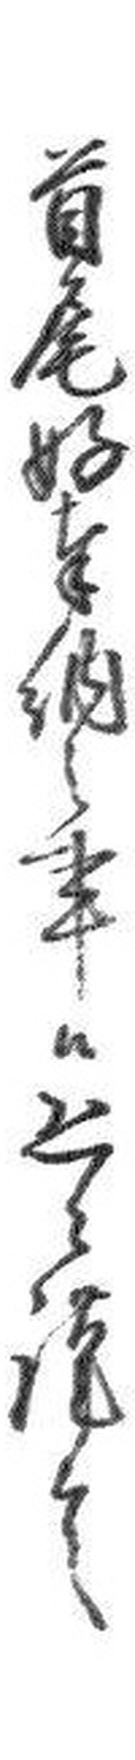首尾好奉納之事候恐々謹言
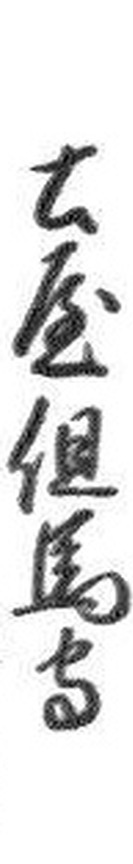土屋但馬守
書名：家譜 十一 昌親公 従延宝二年到延宝四年八月
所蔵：福井県文書館 Fukui Prefectural Archives
